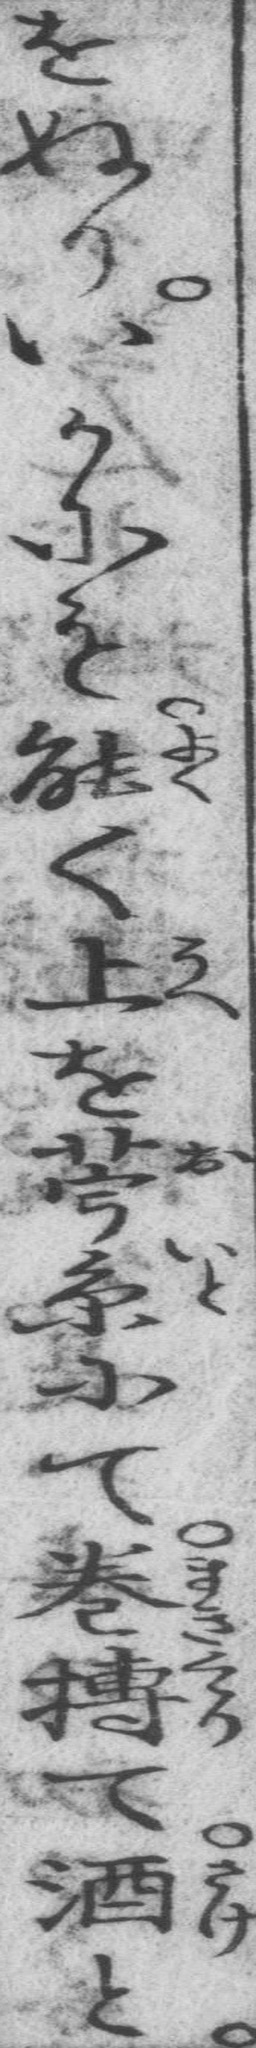をぬり、いかにも。能〳〵上を苧糸にて。巻搏て。酒と。
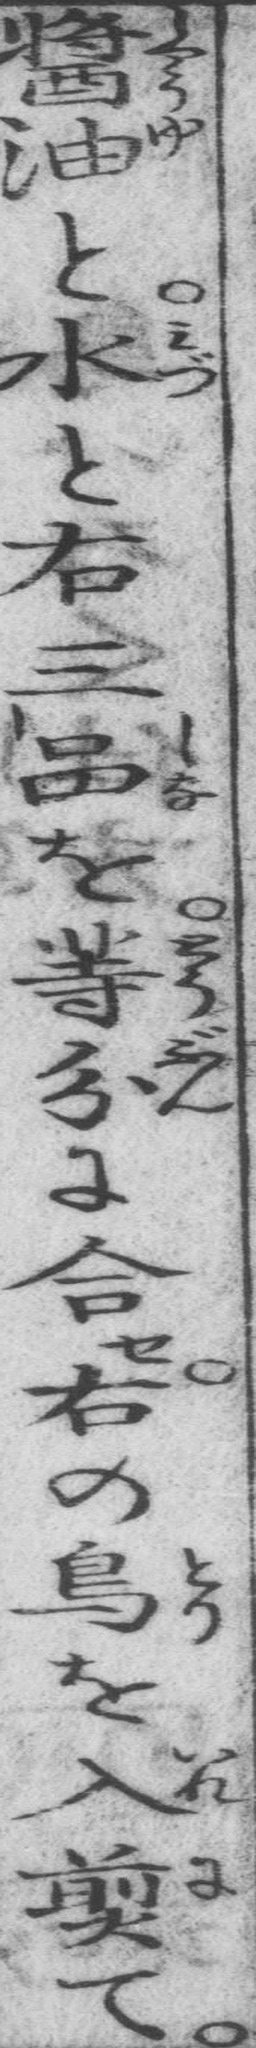醤油と。水と右三品を。等分に合せ。右の鳥を入煎て。
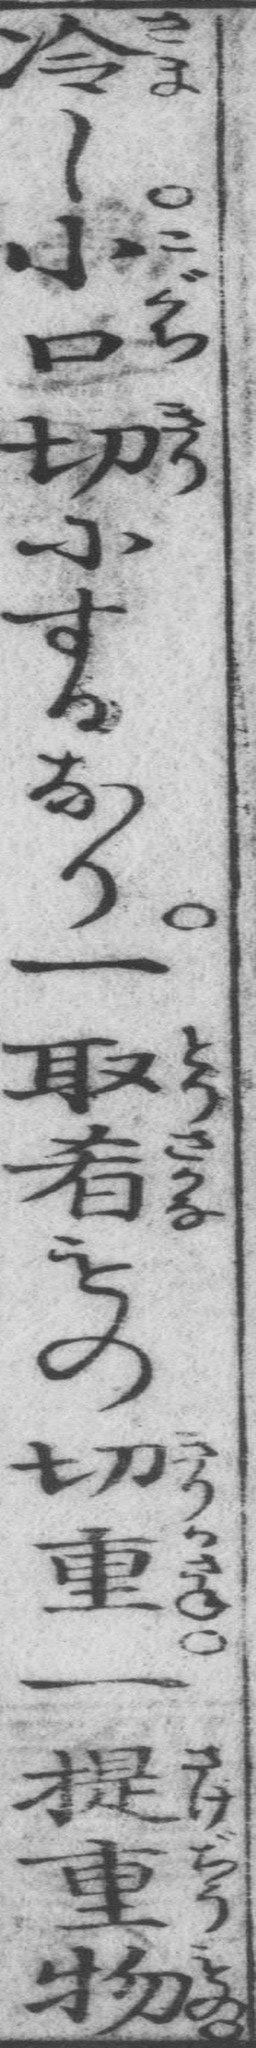冷し。小口切にするなり。一取肴もの切重。一提重物。
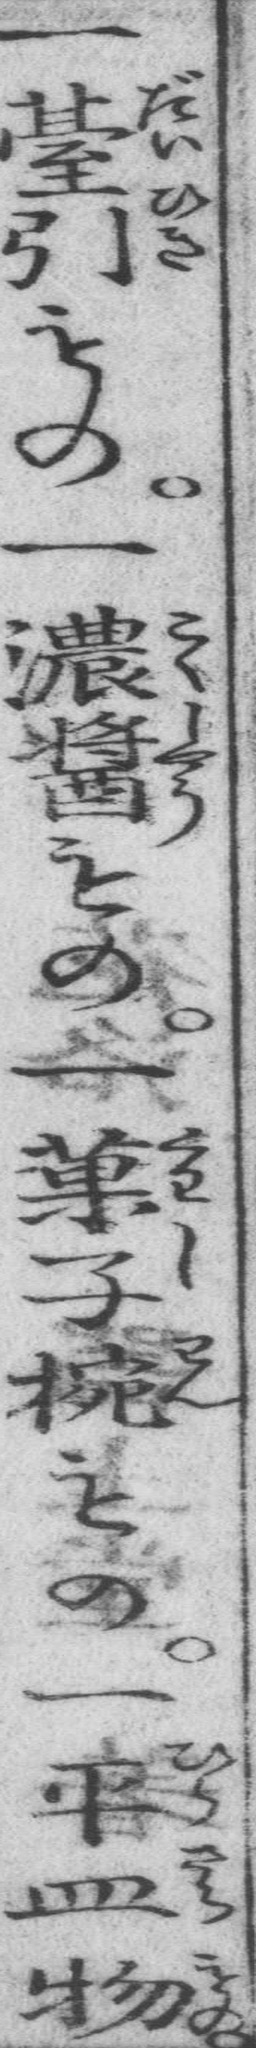一台引もの。一濃醤もの。一菓子椀もの。一平皿物。
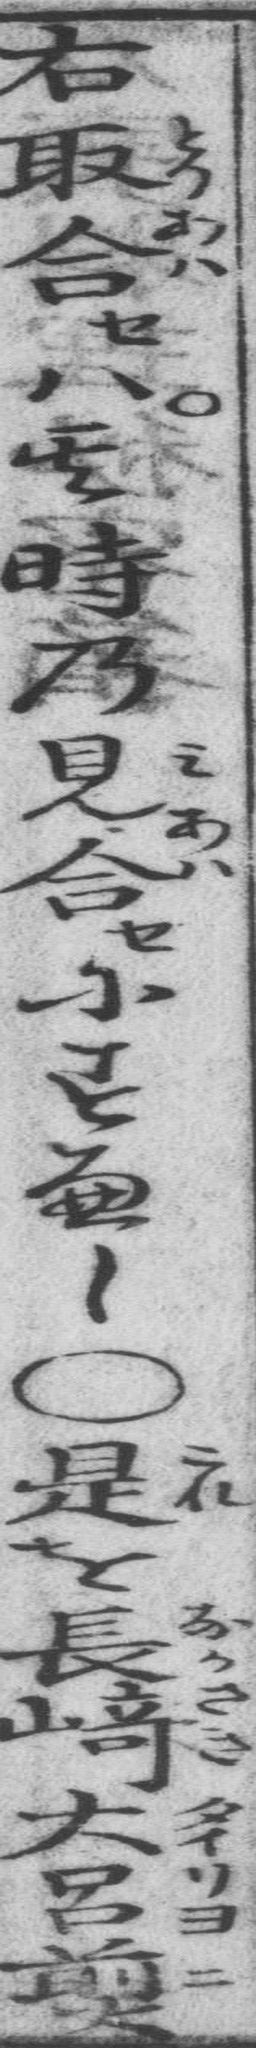右取合せは。其時の見合せにすへし○是を長崎大呂煎
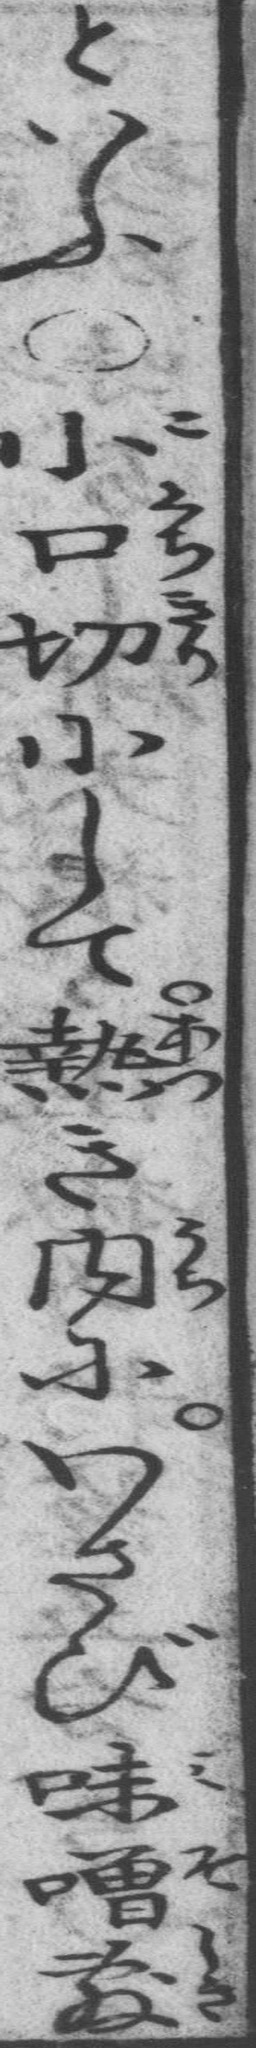といふ○小口切にして。熱き内に。わさび味噌敷
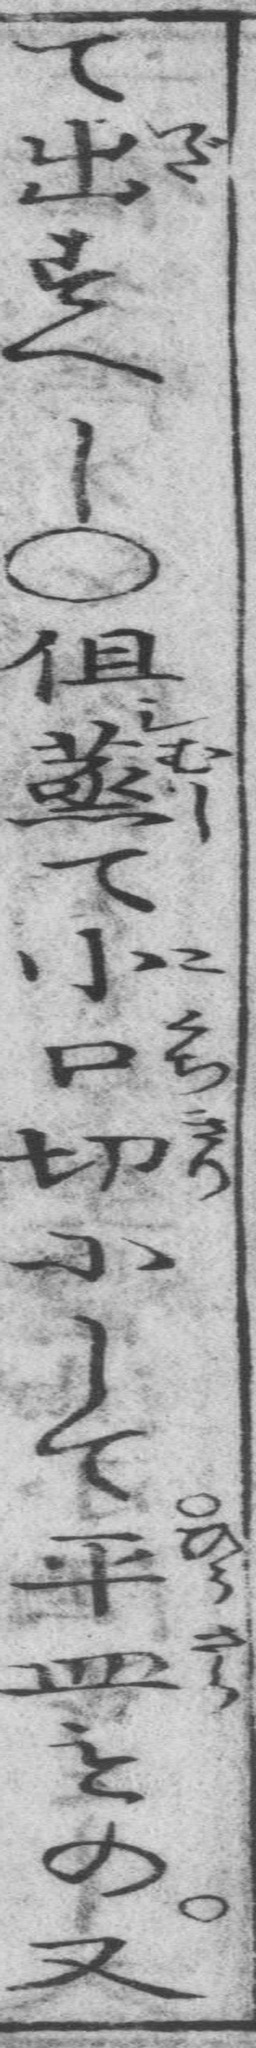て出すへし○但し蒸て小口切にして。平皿もの。又
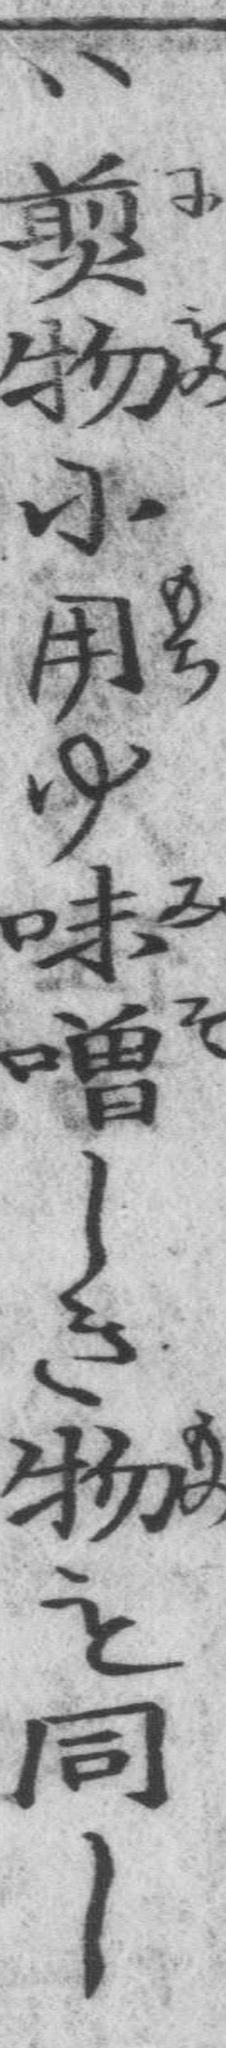は煎物に用ゆ味噌しき物も同し
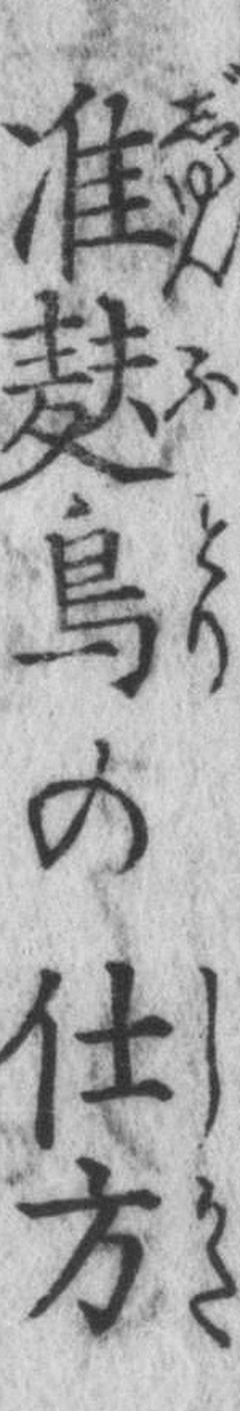准麩鳥の仕方
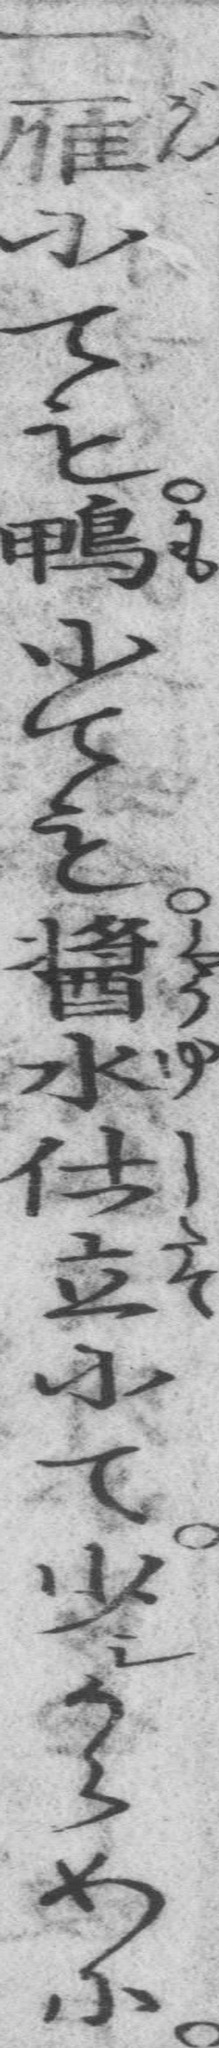一雁にても。鴨にても。醤水仕立にて。少しからめに。
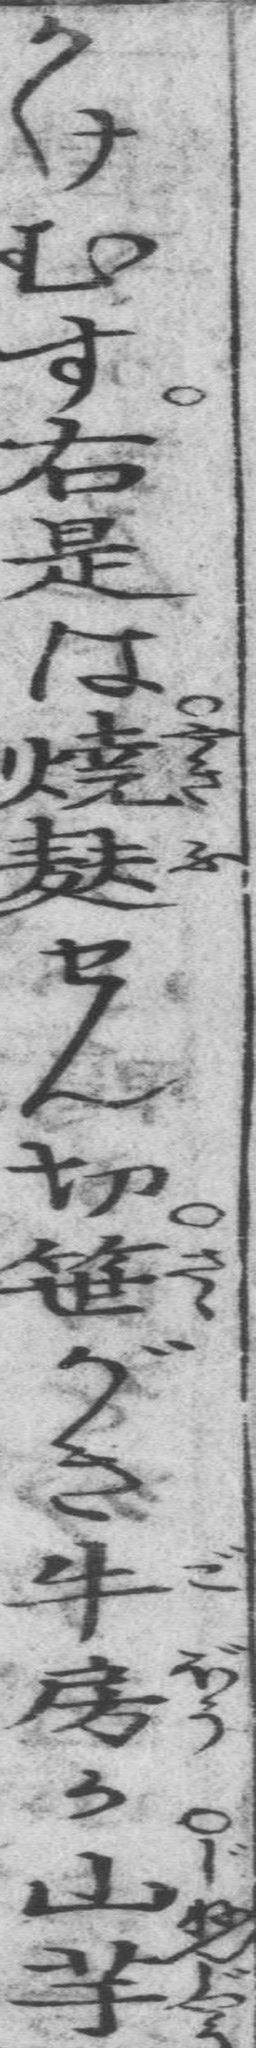かけむす。右是は。焼麩せん切。笹がき牛房か。山芋
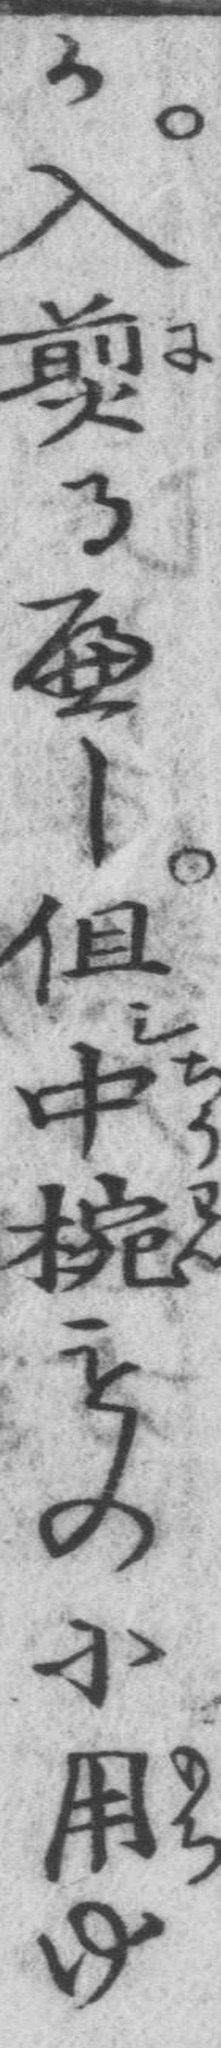か。入煎るへし。但し中椀ものに用ゆ
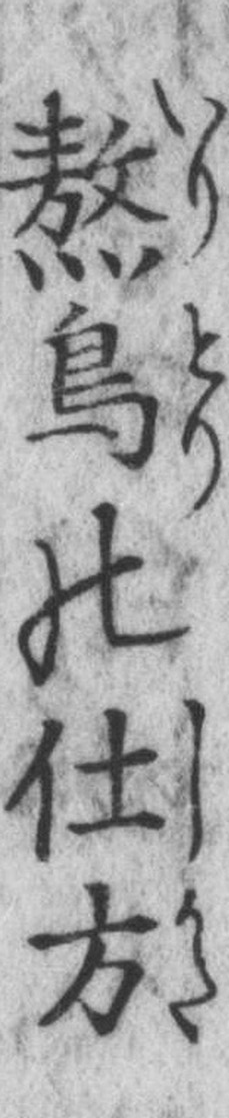熬鳥の仕方
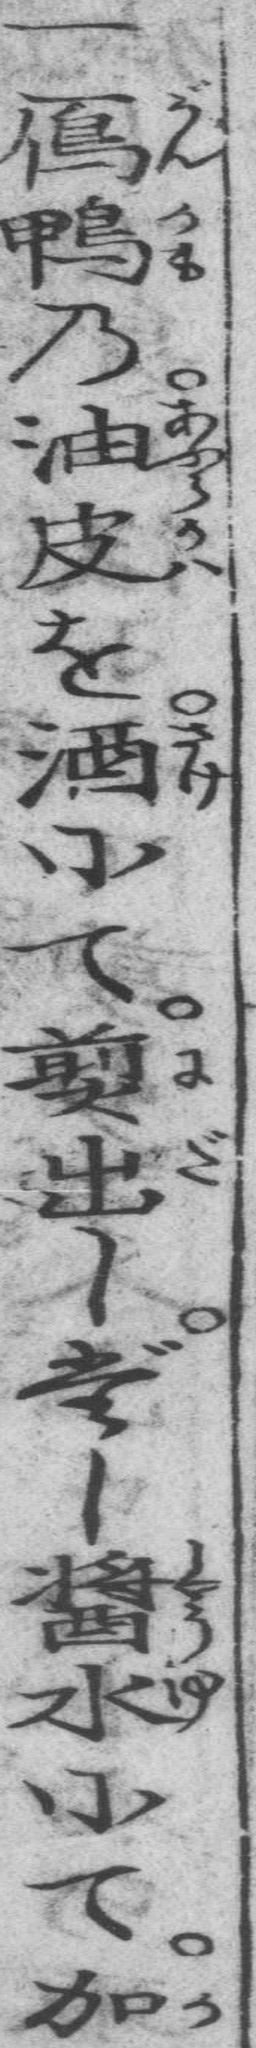一雁鴨の。油皮を。酒にて。煎出し。だし醤水にて。加

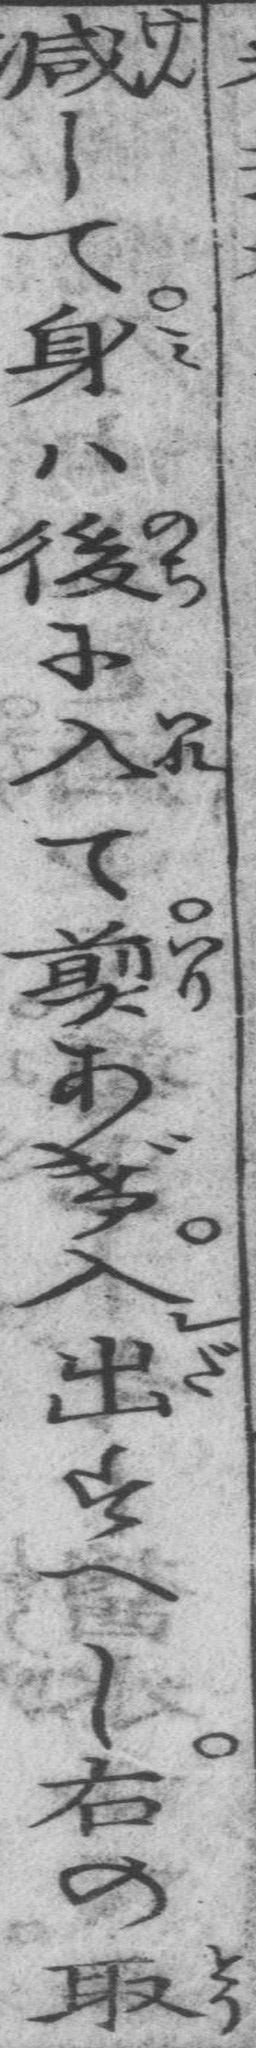減して。身は後に入て。煎あげ。入れ出すへし。右の取
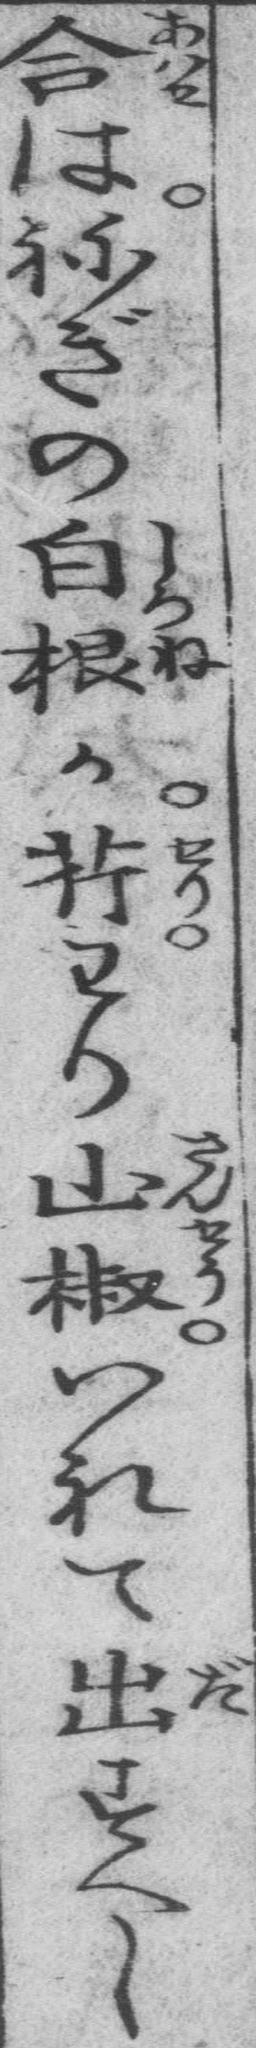合は。ねぎの白根か。芹。わり山椒。いれて出すへし
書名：萬寳料理秘密箱
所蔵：大阪府立大学学術情報センター 国文学研究資料館
